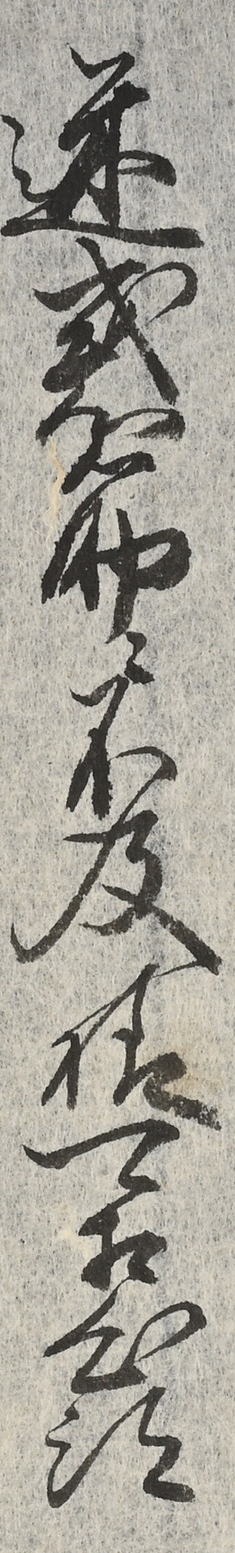迷惑筋ニ不及様可相心得
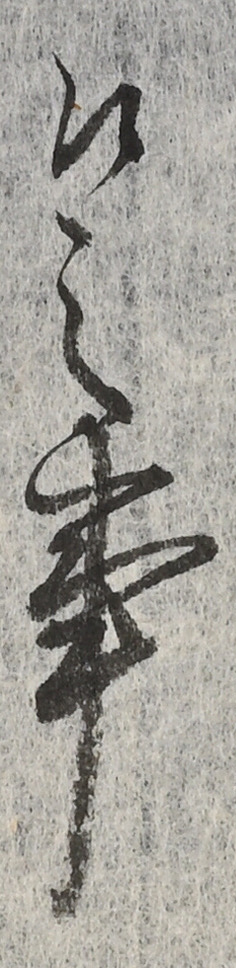候之事
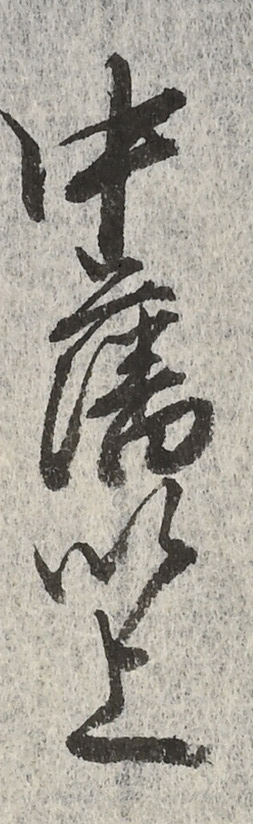中藩以上
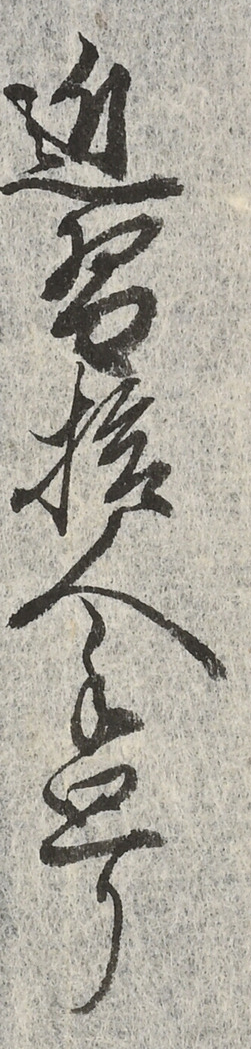近習拾人手廻り
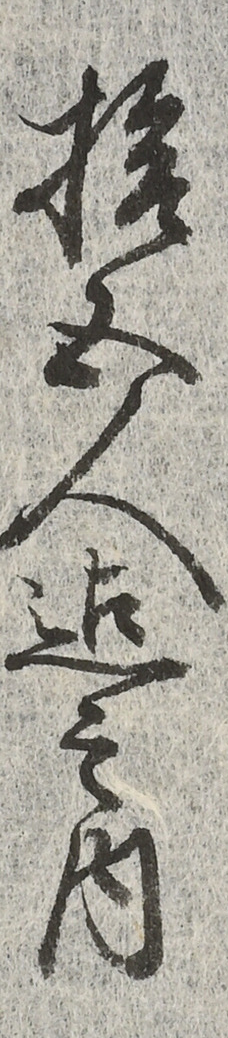拾五人迄之内
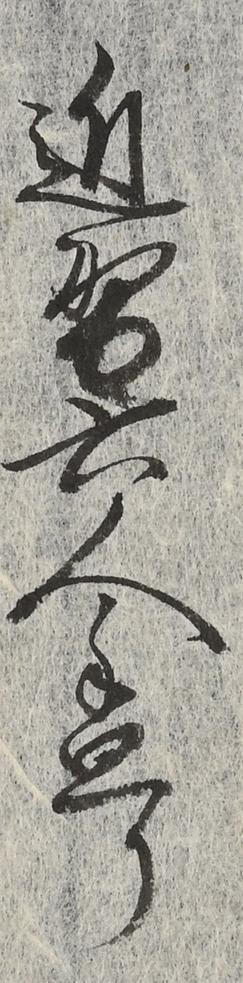近習六人手廻り
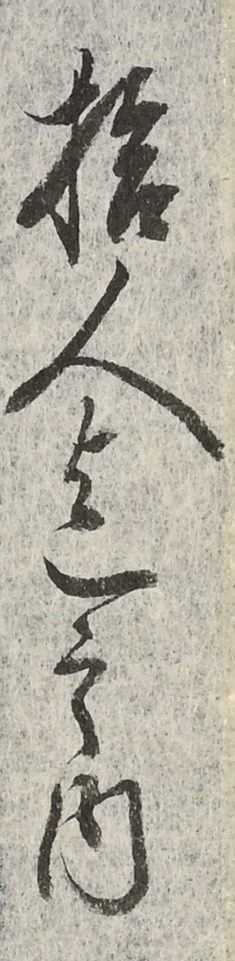拾人迄之内
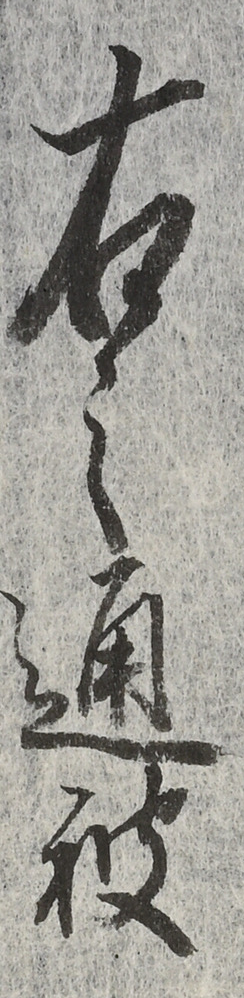右之通被
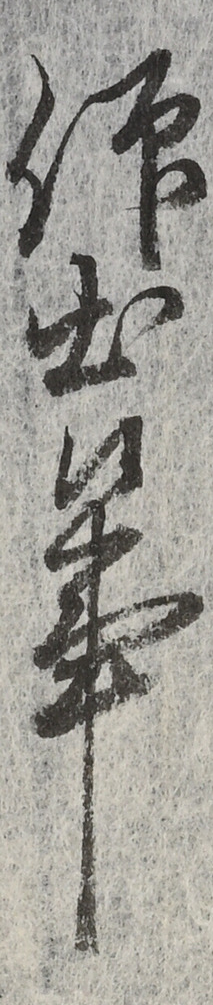仰出候事
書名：布告（写）
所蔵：伊那市立高遠町図書館・合同会社AMANE
